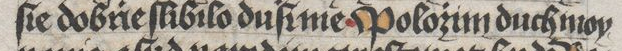ſie dobṙie ſlibilo duẛi me.Polożím duch moy
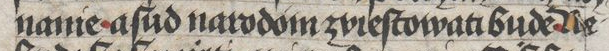nanie.a ſud narodóm zvieſtowati bude.Ne¬
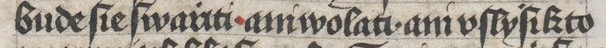bude ſie ſwaṙiti.ani wolati.ani uſlyẛi kto
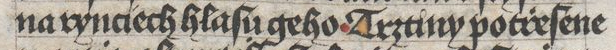na rynciech hlaſu geho.Trztiny potṙeſene
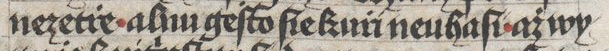nezetṙe.alnu geẛto ſie kuṙí neuhaſi.aż wy¬
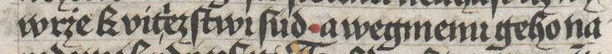wrże k vitiezſtwí ſud.a wegmenu geho na¬
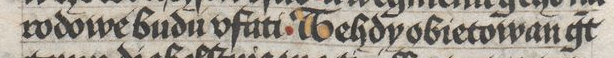rodowé budú ufati.Tehdy obietowan ḡt
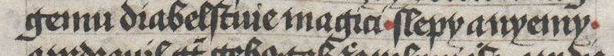gemu diabelſtuie magící.ſlepy a nyemy.
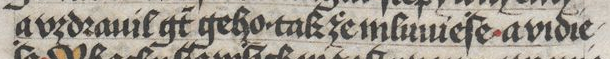a vzdrauil ḡt geho.tak że mluuíeẛe.a vidíe¬
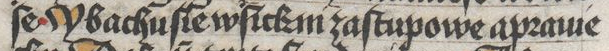ẛe.Y bachu ſie wẛickni zaſtupowe aprauíe¬
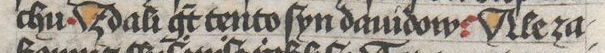chu.Zdali ḡt tento ſyn dauidow?Ale za¬
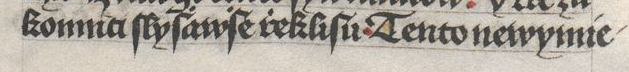konnnici ſlyſawẛe ṙekli ſu.Tento newymíe
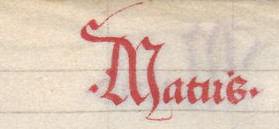Matuṡ.
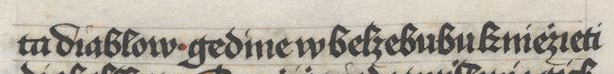ta diablow.gedine wbelzebubu knieżieti
